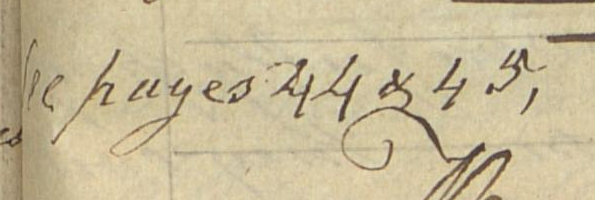See pages 44 & 45
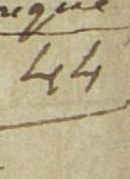44
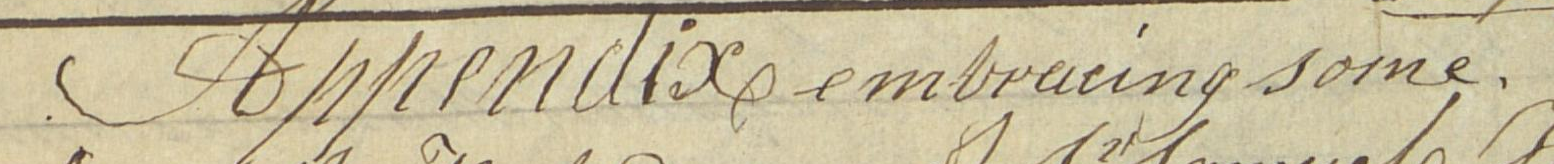Appendix embracing some.
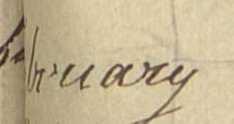bruary
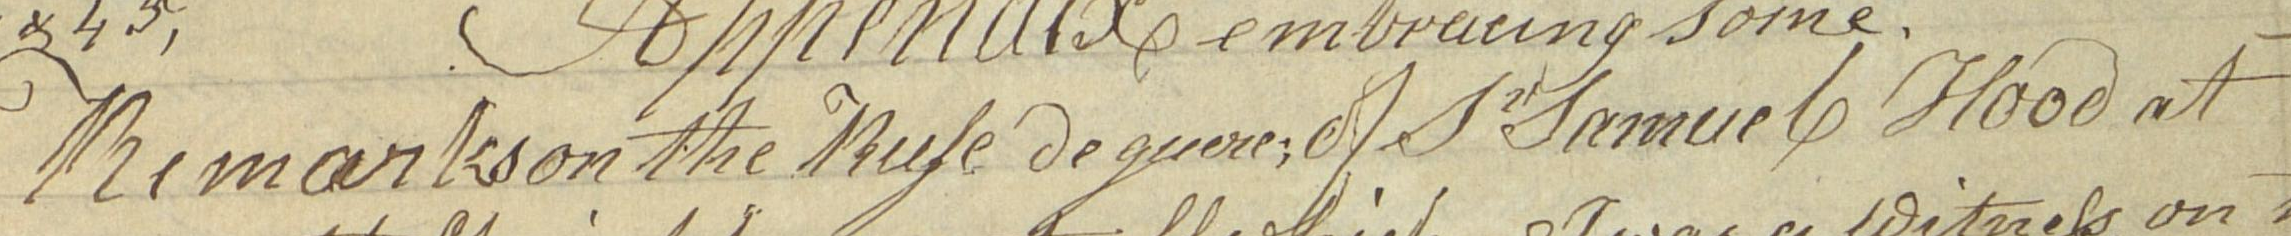Remarks on the Ruse de guere; of S^r Samuel Hood at
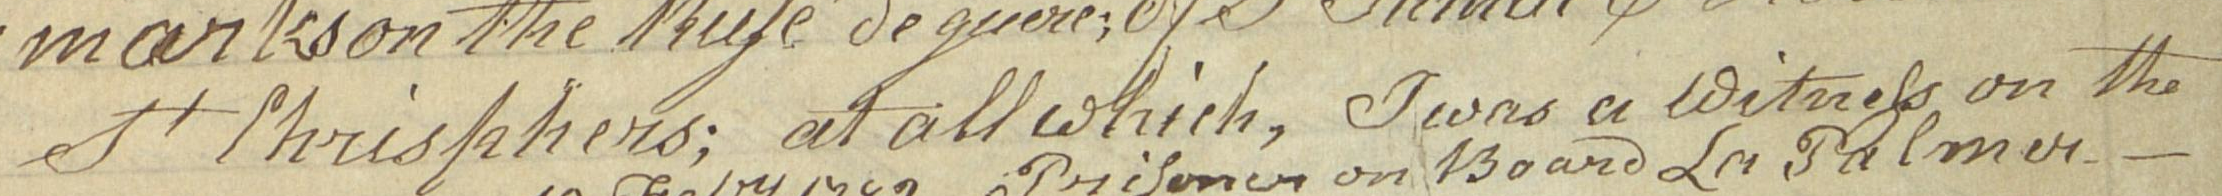S^t Christophers; at all which, I was a Witness on the
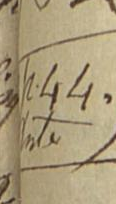p 44
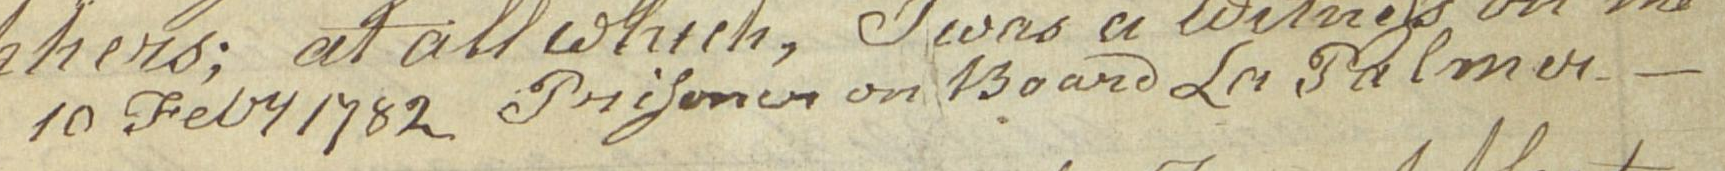10 Feb^y 1782 Prisoner on Board La Palmer
